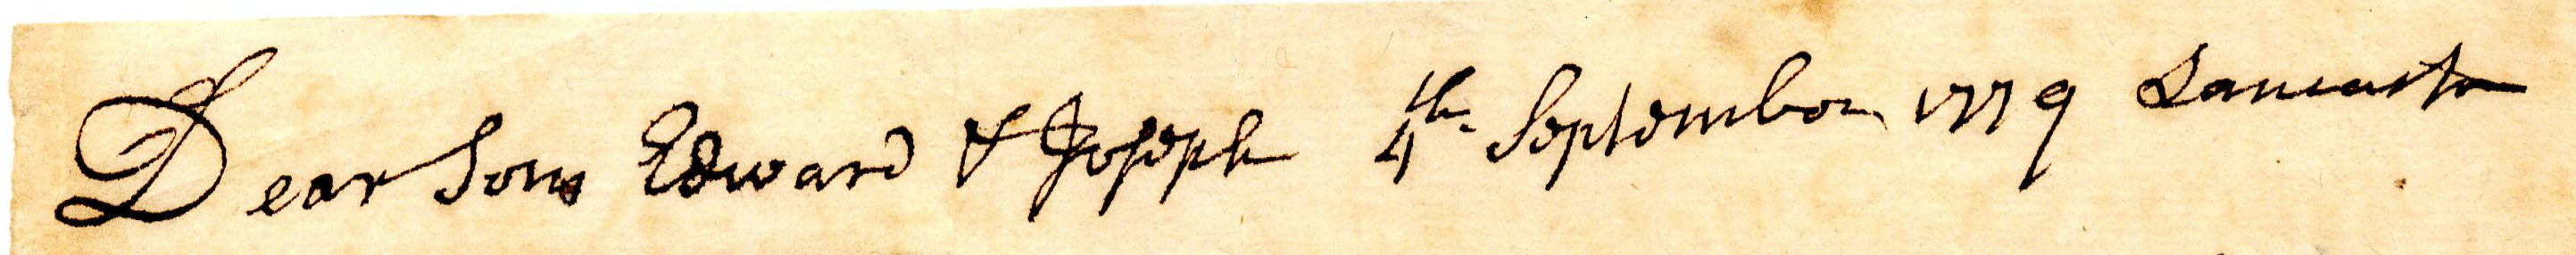Dear Sons Edward & Joseph 4^th. September 1779 Lancaster
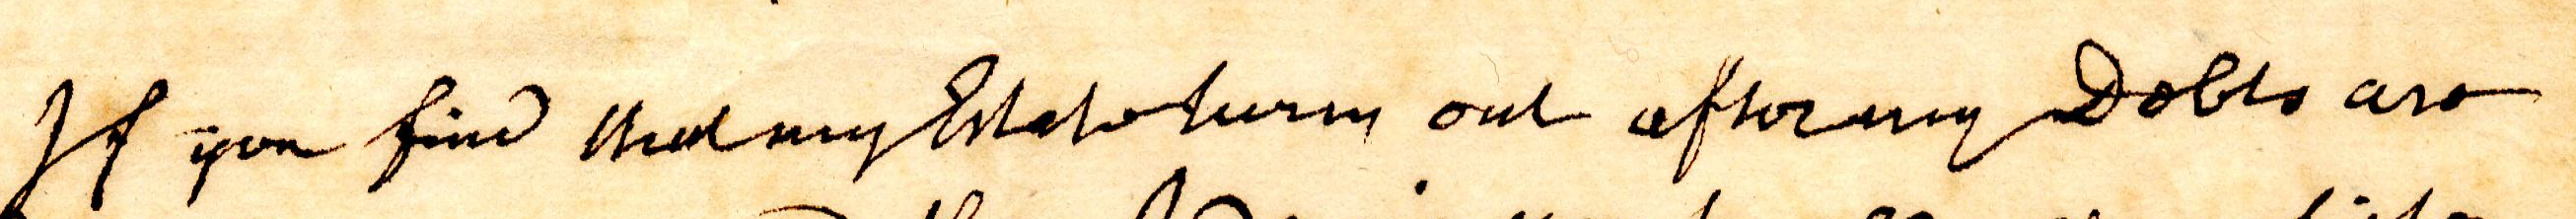If you find that my Estate turns out after my Debts are
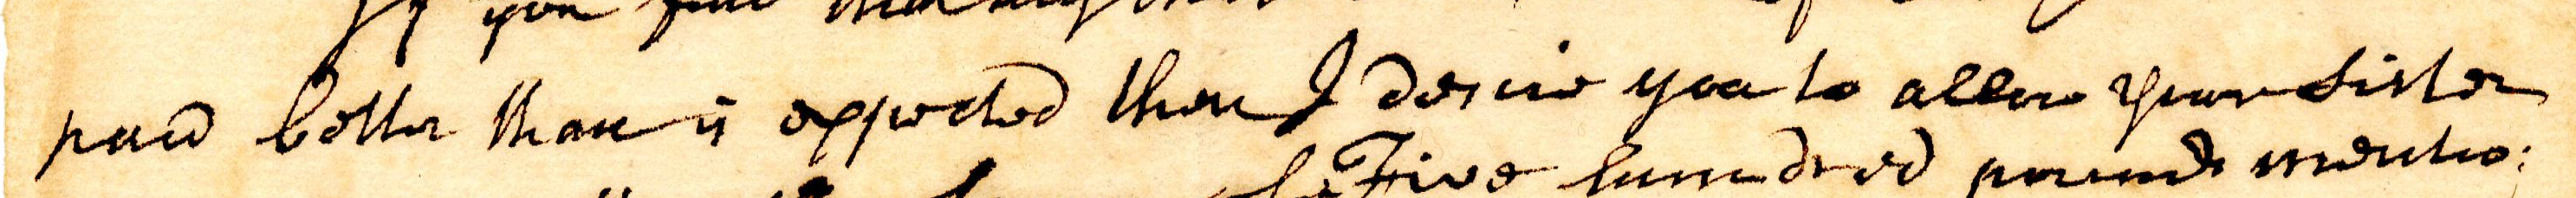paid better than is expected then I desire you to allow Your sister
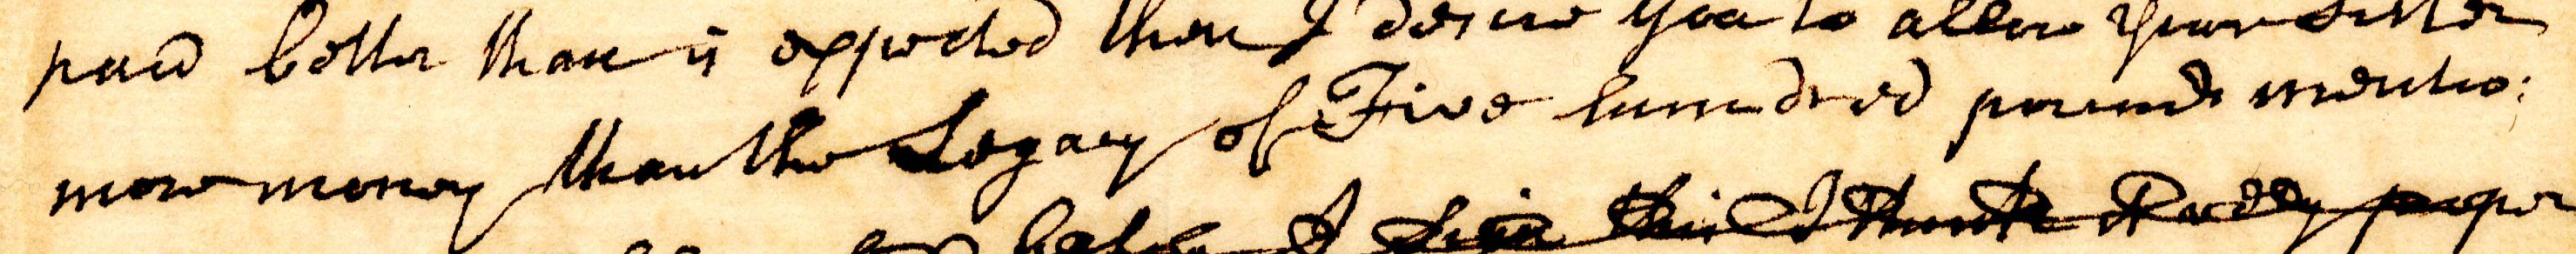more money than the Legacy of Five hundred pounds mentio:
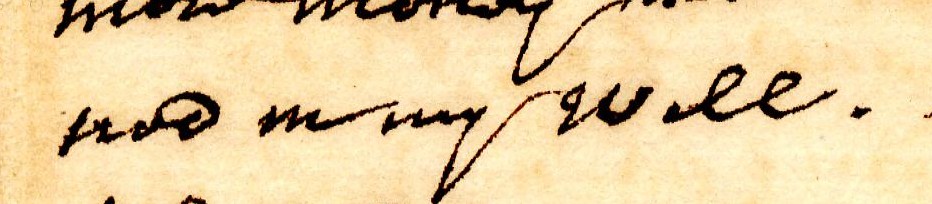ned in my will.
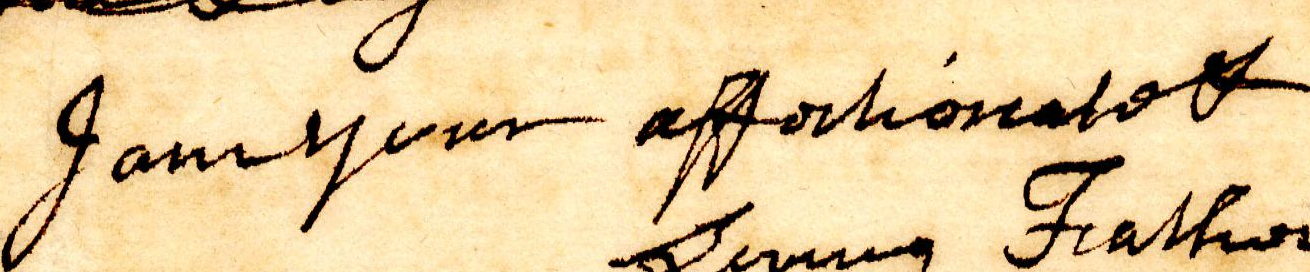I am your affectionate &
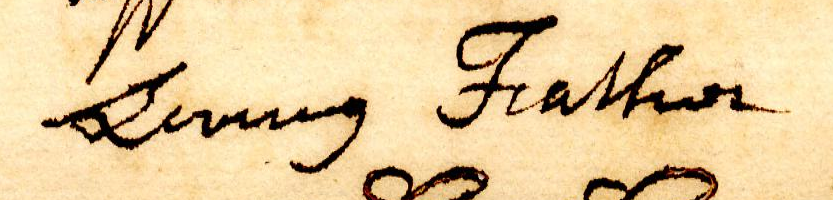Loving Father
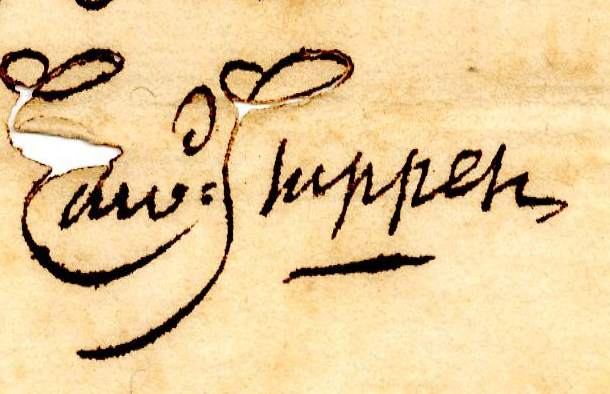Edw^d: Shippen
